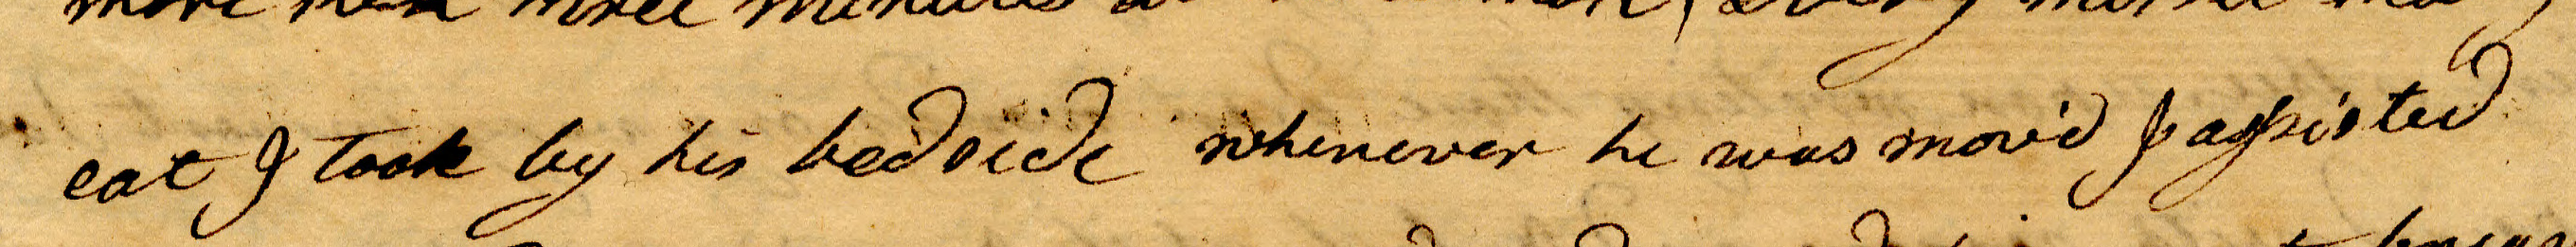eat I took by his bedside whenever he was mov'd I assisted
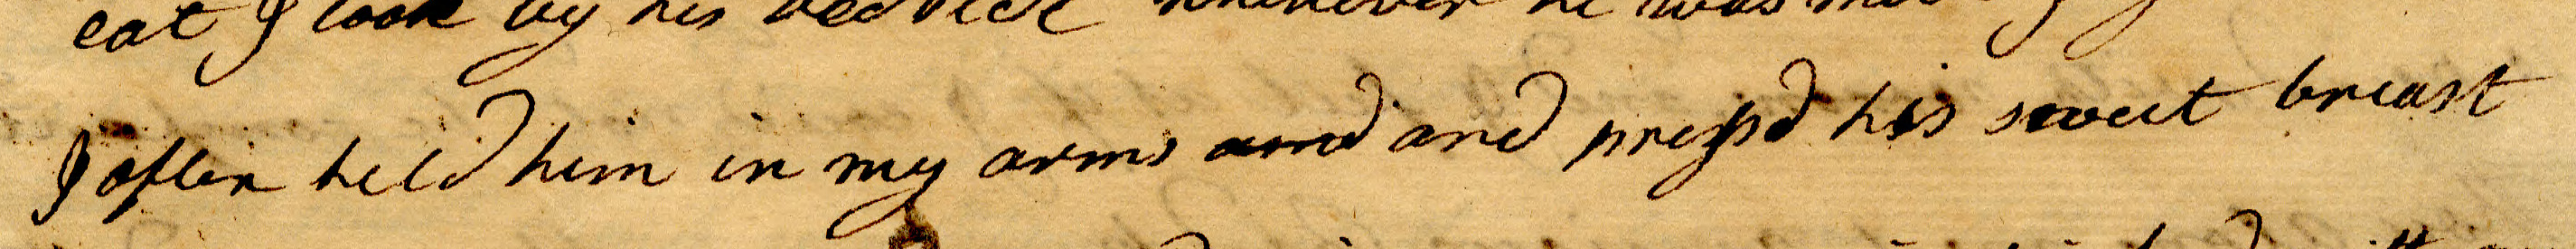I often held him in my arms and pressd his sweet breast
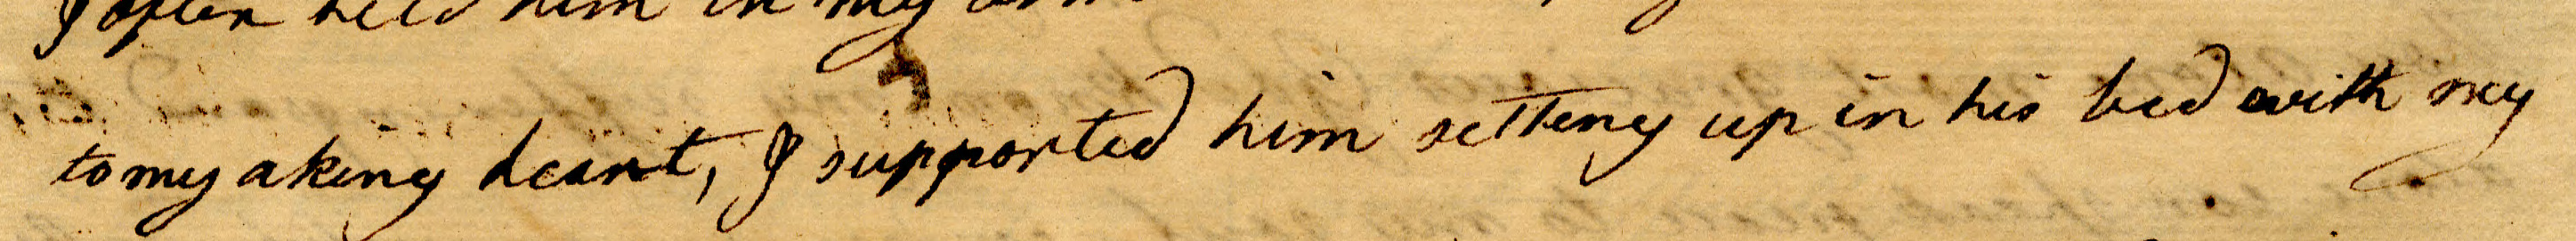to my aking heart, I supported him setting up in his bed with my
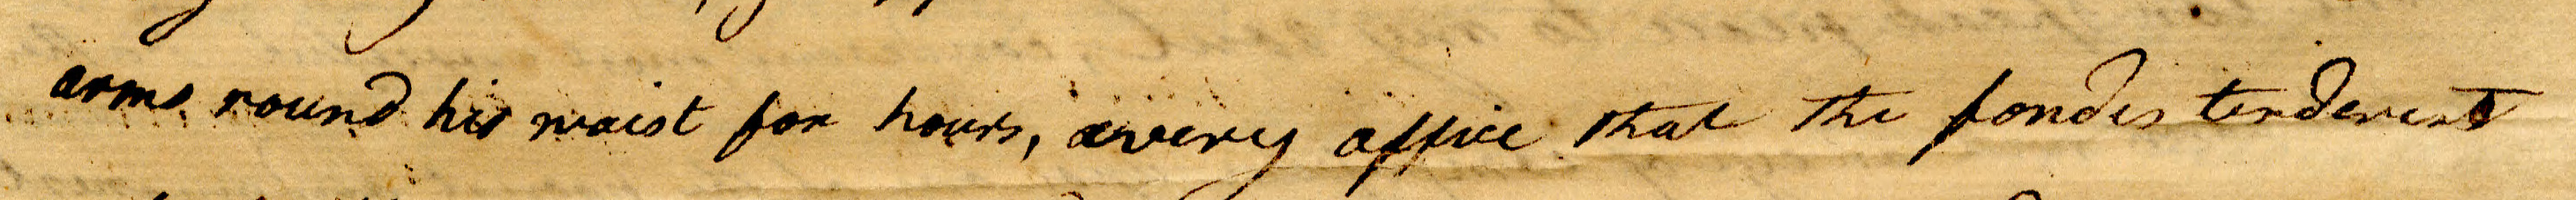arms round his waist for hours, every office that the fondes tenderest
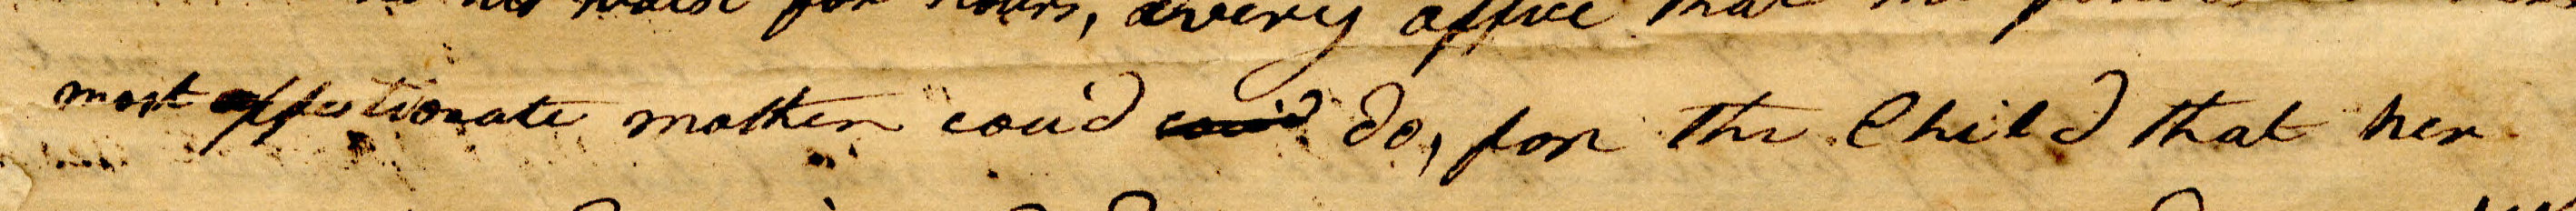most aaffectionate mother cou'd [cou'd] do, for the Child that her
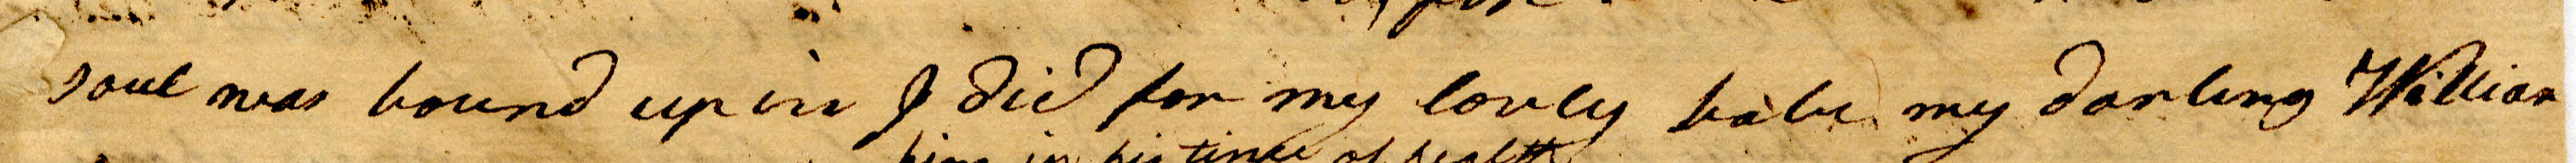soul was bound up in I did for my lovly babe my darling William
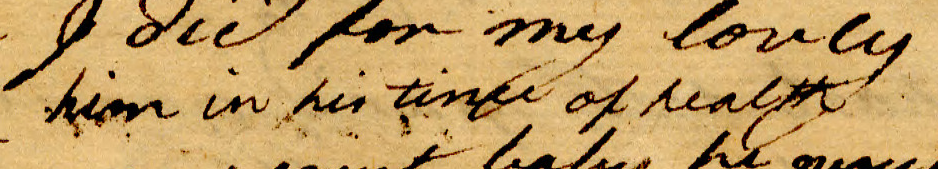him in the time of health
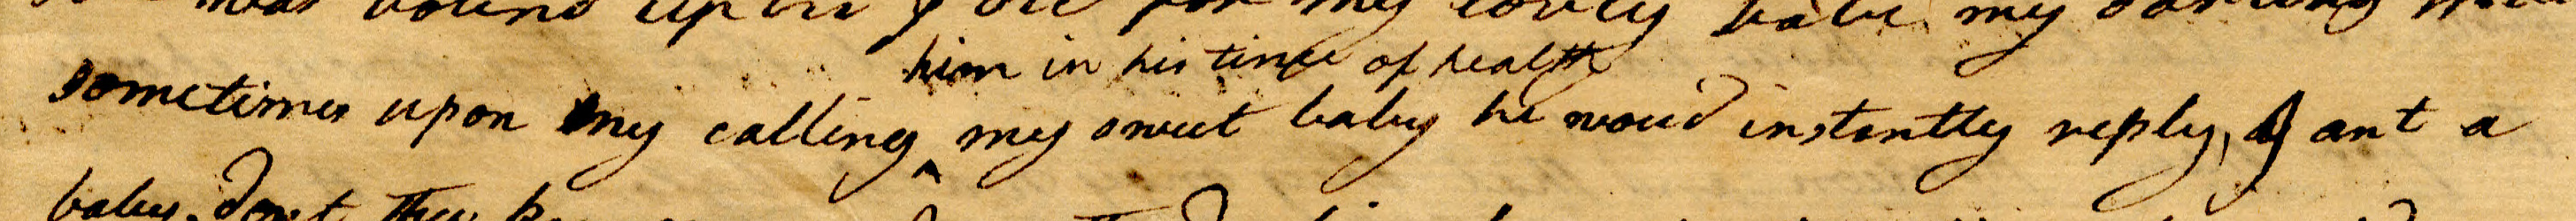sometimes upon my calling ^ my sweet baby he woud instantly reply, I ant a
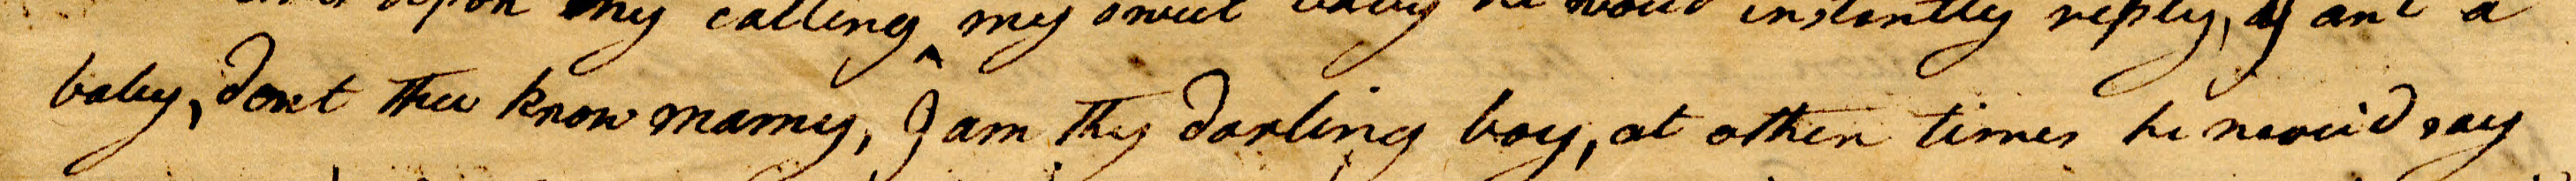baby, dont thee know mamy, I am thy darling boy, at other times he wou'd say
